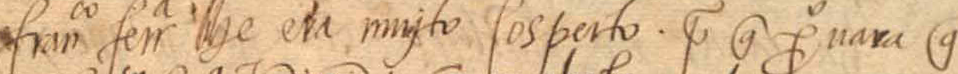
franco ferra lhe era mujto sospeito p̄o q̅ ꝓouara q̅
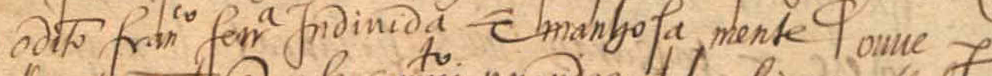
o dit̅o franco ferra Jndiuida E manhosamente ouue ꝑ
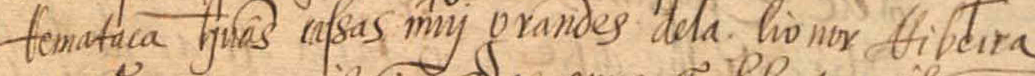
Remataça̅ hua̅s cassas mujto grandes dela lionor Ribeira
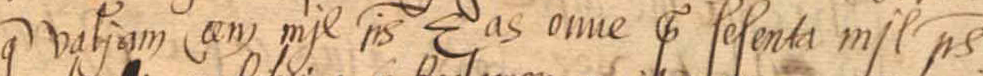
q̅ valjam çem mjl r̅rs E as ouue p̄o sesenta mjl r̅rs
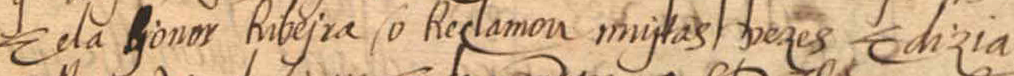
E ela ljonor Ribejra o Reclamou mujtas vezes E dizia
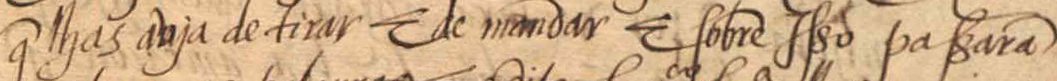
q̅ lhas avja de tirar E demandar E sobre Jsso passara̅
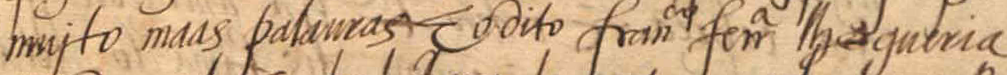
mujto maas palauras E o dito franco ferra lhe queria
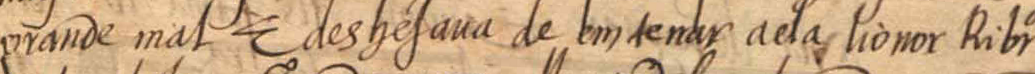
grande mal E desheJaua de emterrar a ela lionor Ribra
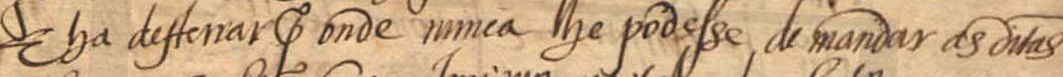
E ha desterrar p̄o onde nunca lhe podesse demandar as di̅tas
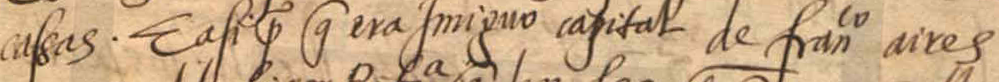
cassas. E asi p̄o q̅ era Jmiguo capitaL de franco aires
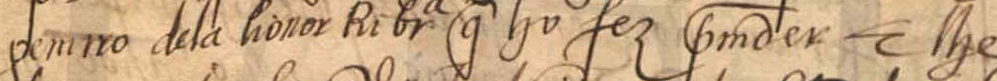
gemrro dela lionor Ribra q̅ ho fez p̄mder E lhe
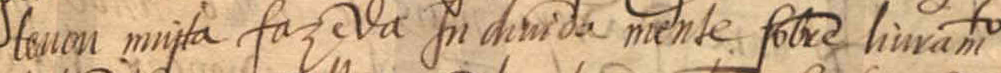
leuou mujta faze̅da Jndiuidamente sōbre liuramto
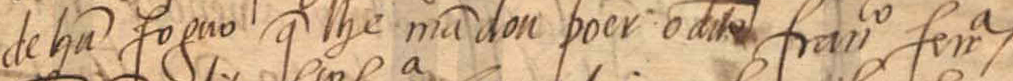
de hu̅ foguo q̅ lhe ma̅dou poer o d̅ito franco ferra /
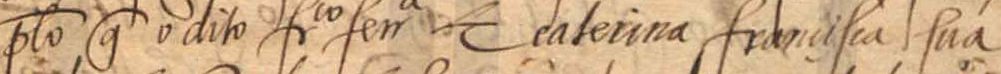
p̅lo q̅ o dito frco ferra E caterina françisca sua
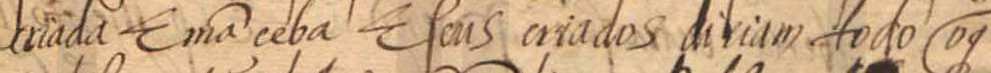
criada E ma̅çeba E seus criados diriam todo o q̅
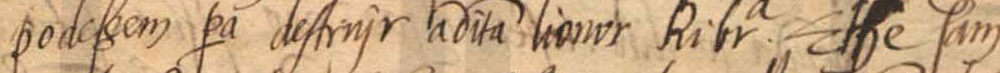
podessem ꝑa destrujr a di̅ta lionor Ribra E lhe sam
